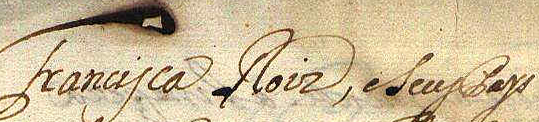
Francisca Roiz̄, e Seus Pays
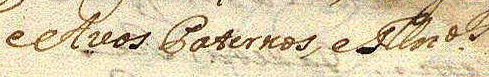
e Avos Paternos, e Mn.os
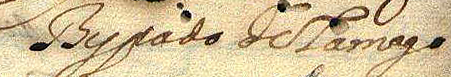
Bispado de Lamego
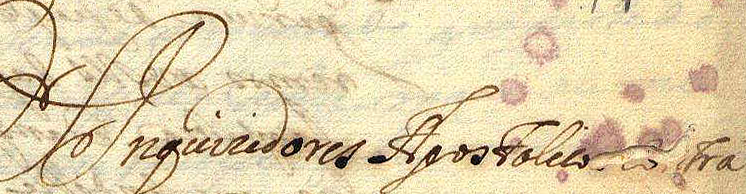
OS Inquizidores Apostolico_ Co_tra
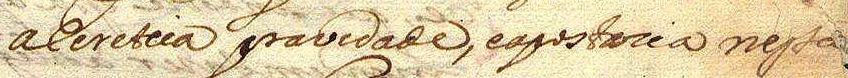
a heretica pravidade, e apostazia nesta
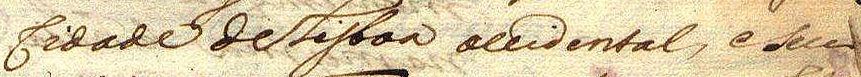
Cidade de Lisboa occidental, e seu
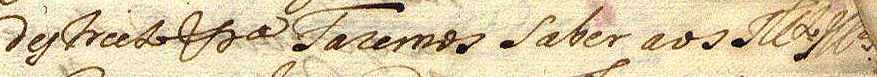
destricto &a Fazemos saber aos Mto. Illes.
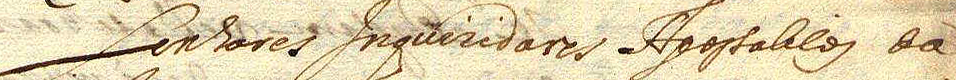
Senhores Jnquizidores Apostolicos da
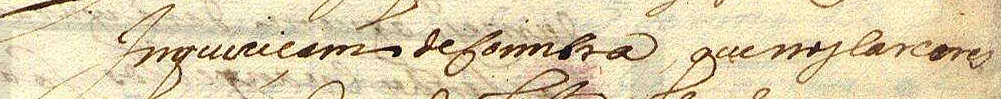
Jnquiziçam de Coimbra, que nos carceres
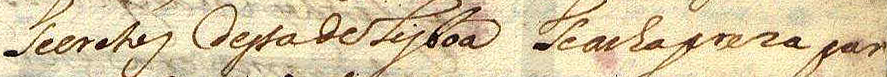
secretos desta de Lisboa se acha preza por
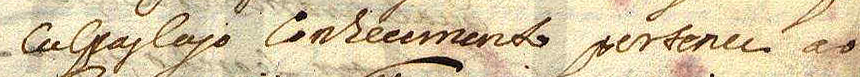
culpas cujo conhecimento pertence ao
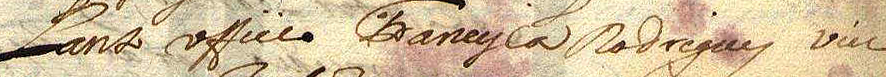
Santo officio Francisca Rodrigues viu
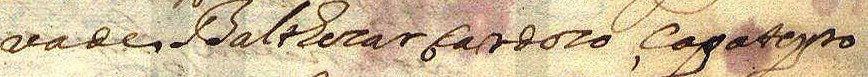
va de Balthezar Cardozo çapateyro
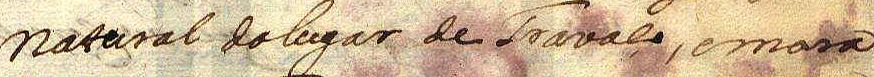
natural do lugar de Travaço, e mora
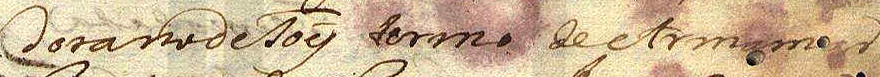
dora no de Toẽs termo de Armamar
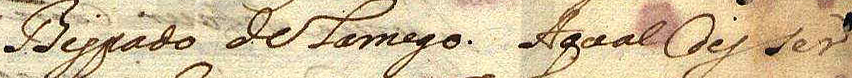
Bispado de Lamego. A qual dis ser
